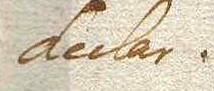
declar.
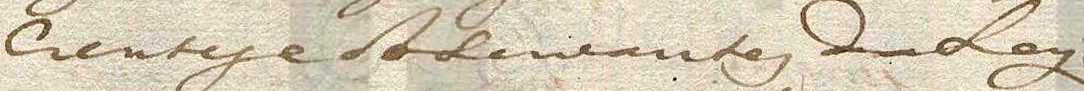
crentes e observantes da Ley
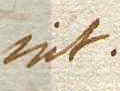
int.
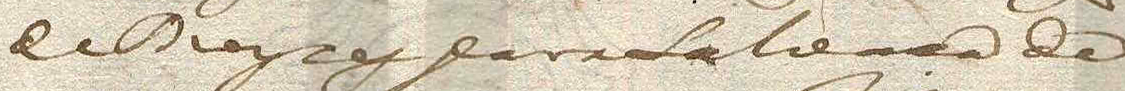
de Moyzes para salvacaõ de
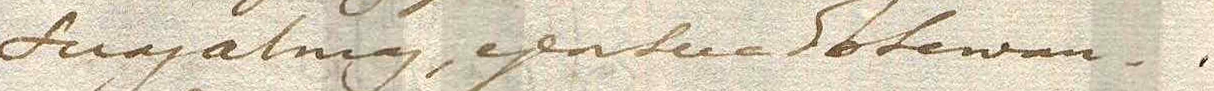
suas almas, e por sua observan
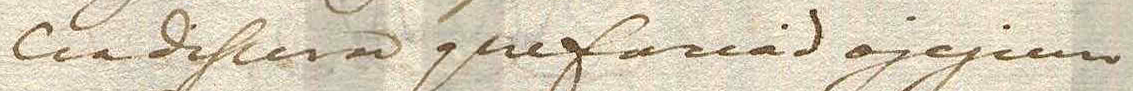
cia disseraõ que faziaõ o jejum
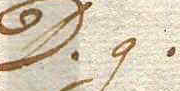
D. g.
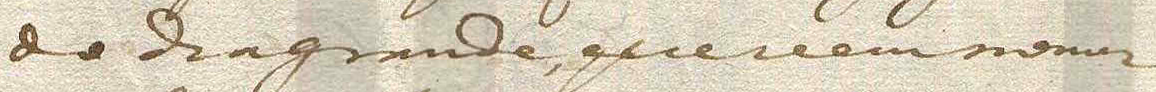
do dia grande, que vem no mez
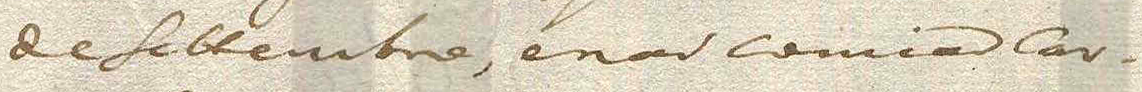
de settembro, e naõ comiaõ car
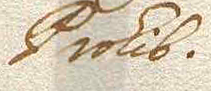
Prohib.
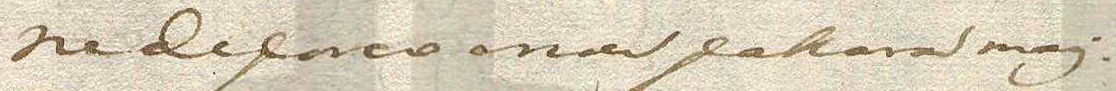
ne de porco e naõ fallara mais
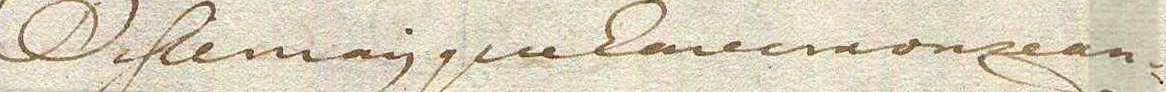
Disse mais que havera onze an
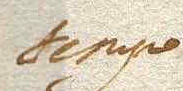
tempo
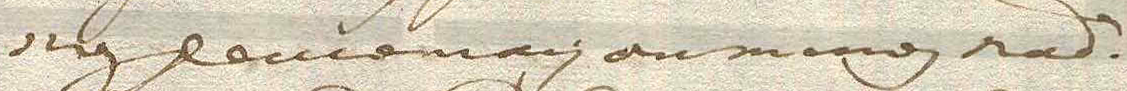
nos pouco mais ou menos na d.a
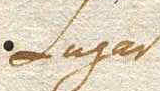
Lugar
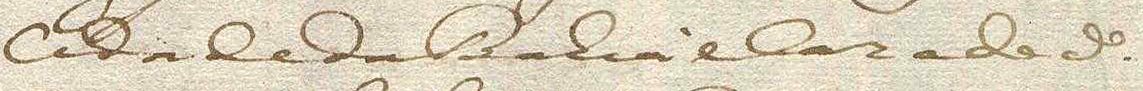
cidade da Bahia e caza do d.o
